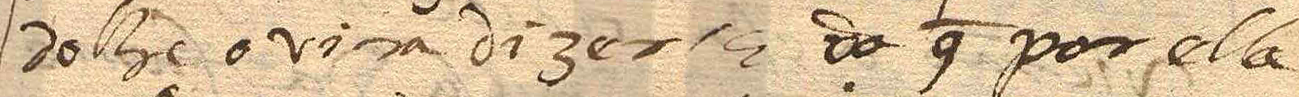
dolhe ovira dizer / E do q̄ por ella
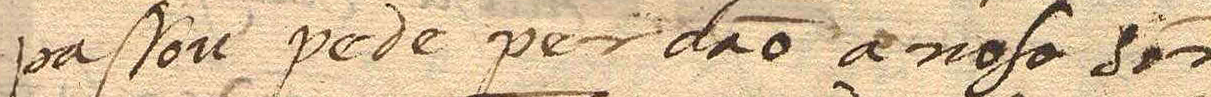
passou pede perdão a noso sōr
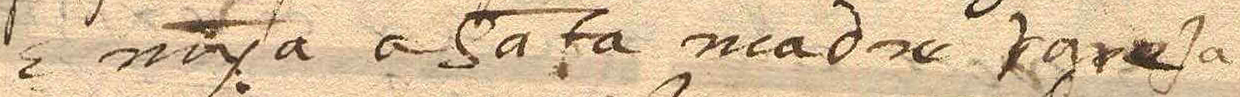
E mȳa a s̄ata madre IgreJa
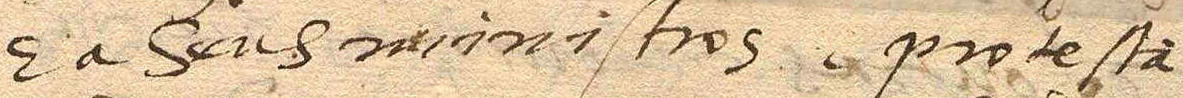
E a seus ministros e protesta
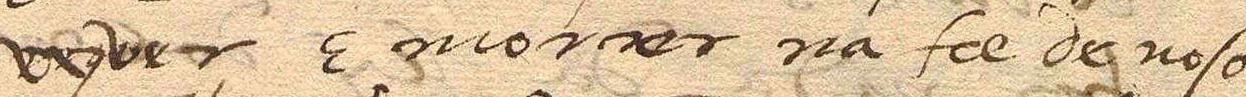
vyver E morrer na fee de noso
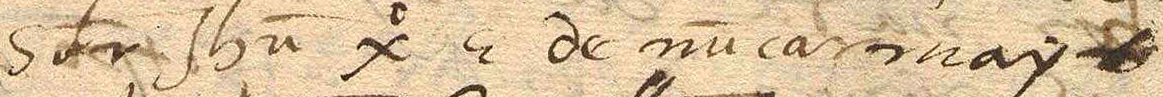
sōr Jhū xo E de nūca may_
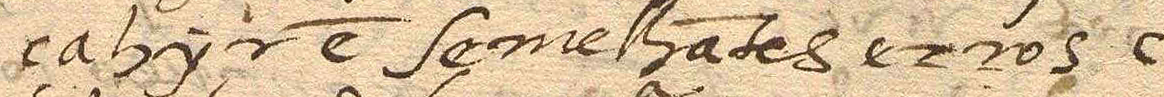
cahyr ē semelhātes erros e
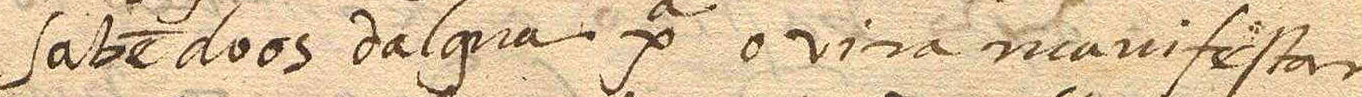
sabēdoos dalgua pa o vira manifestar
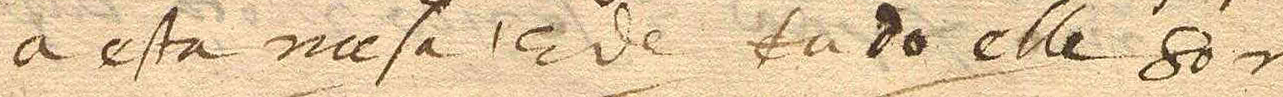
a esta mesa / E de tudo elle sōr
